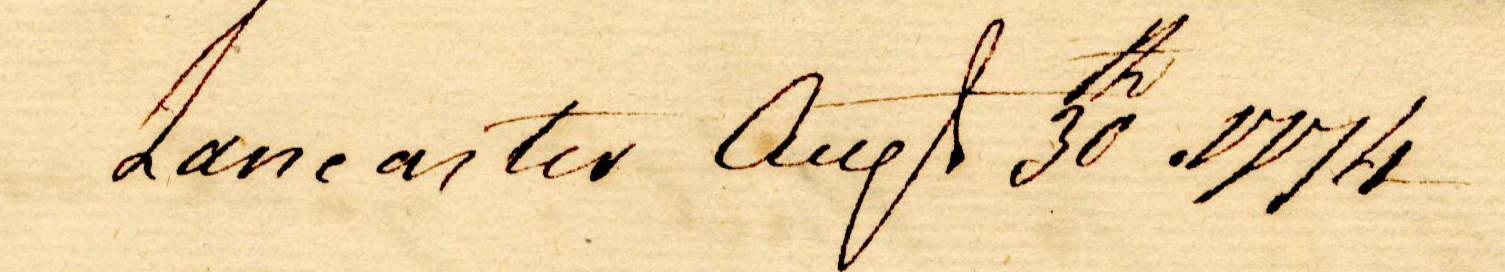Lancaster Aug^t 30^th. 1774
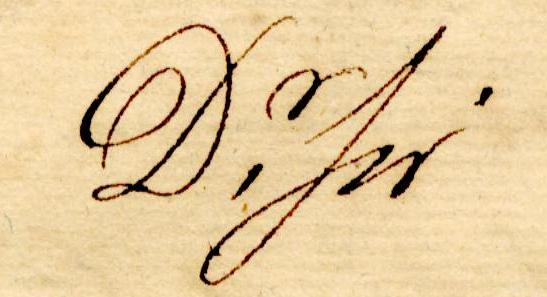D^r. Sir
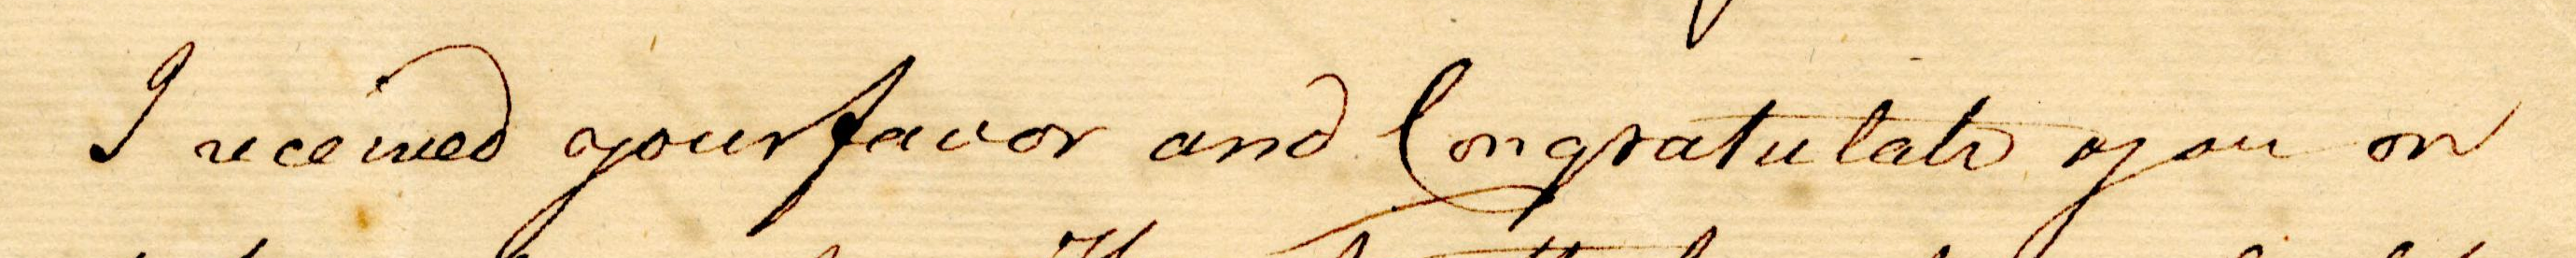I received your favor and Congratulate you on
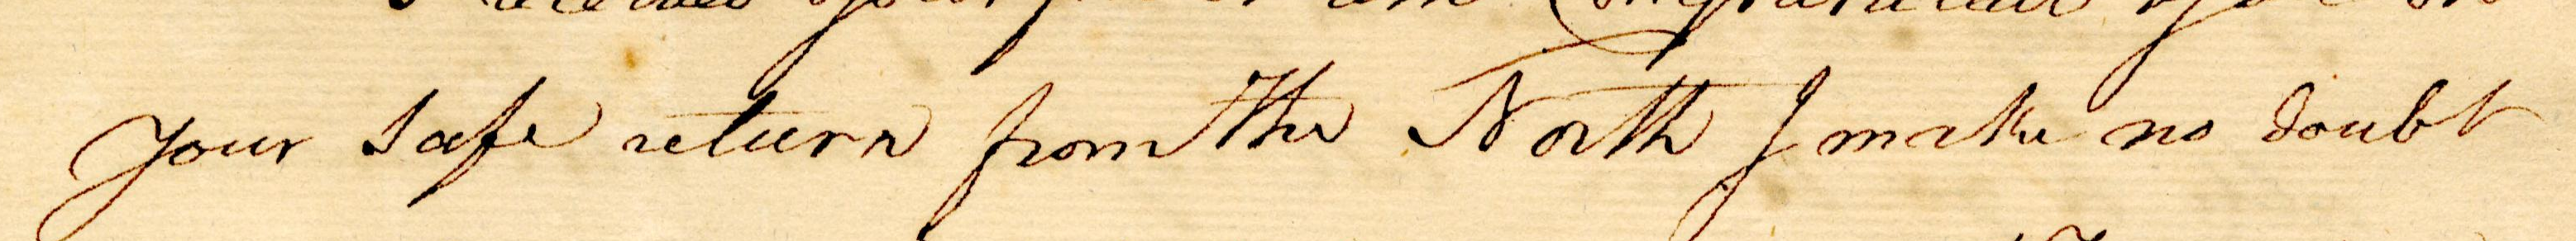your Safe return from the North I make no doubt
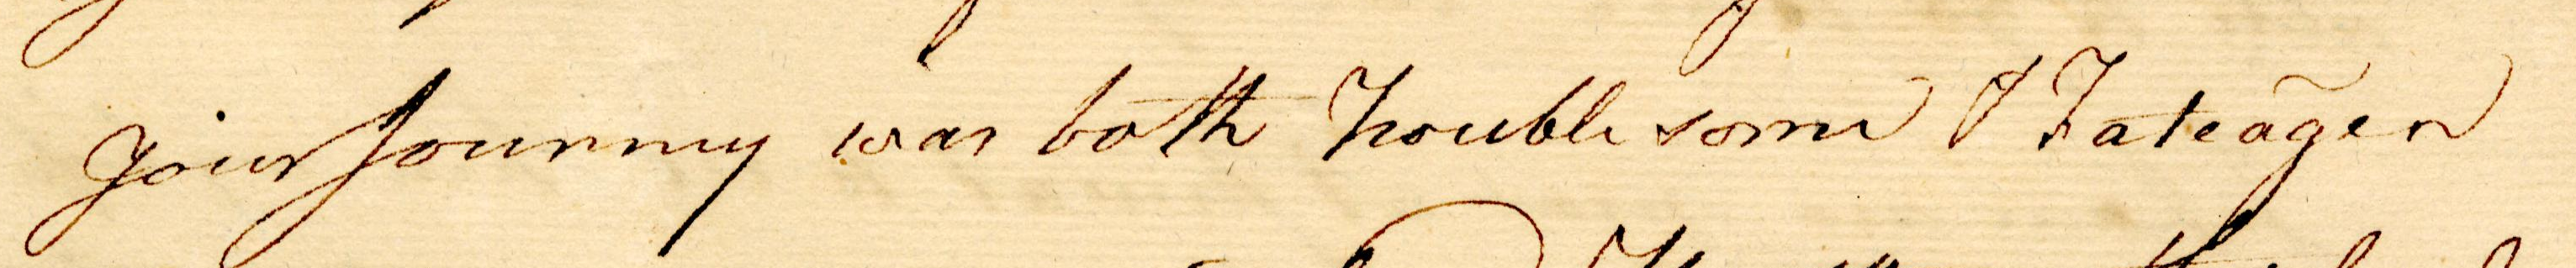your Journey was both Trouble some & late agen
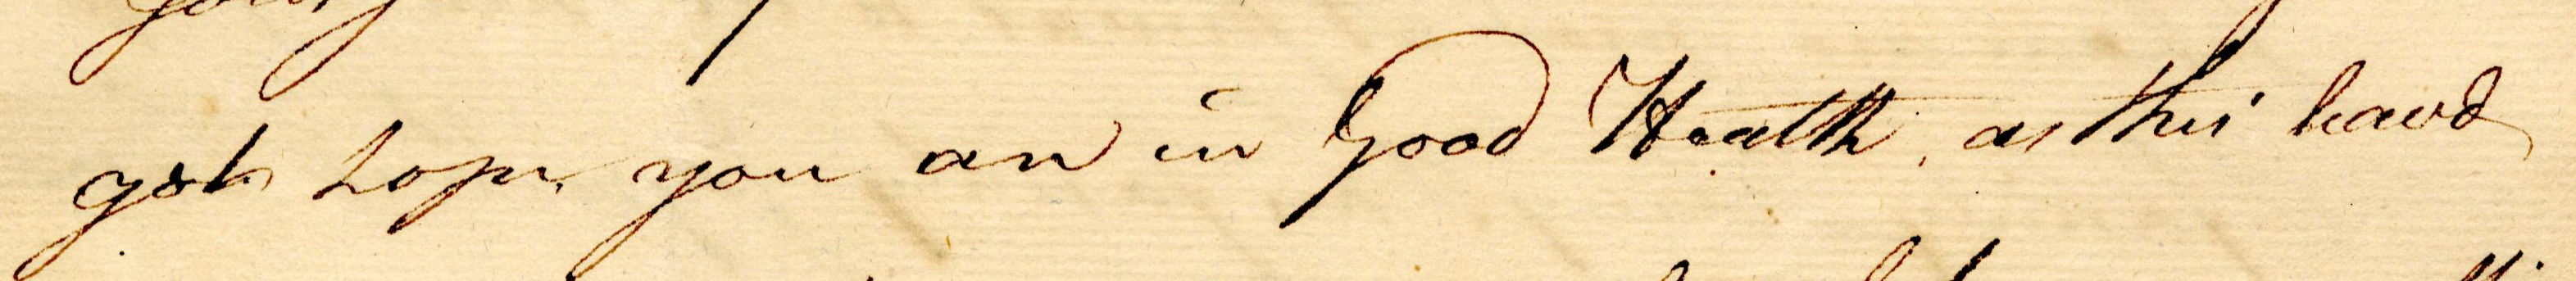yet hope you are in Good Health, as this leave
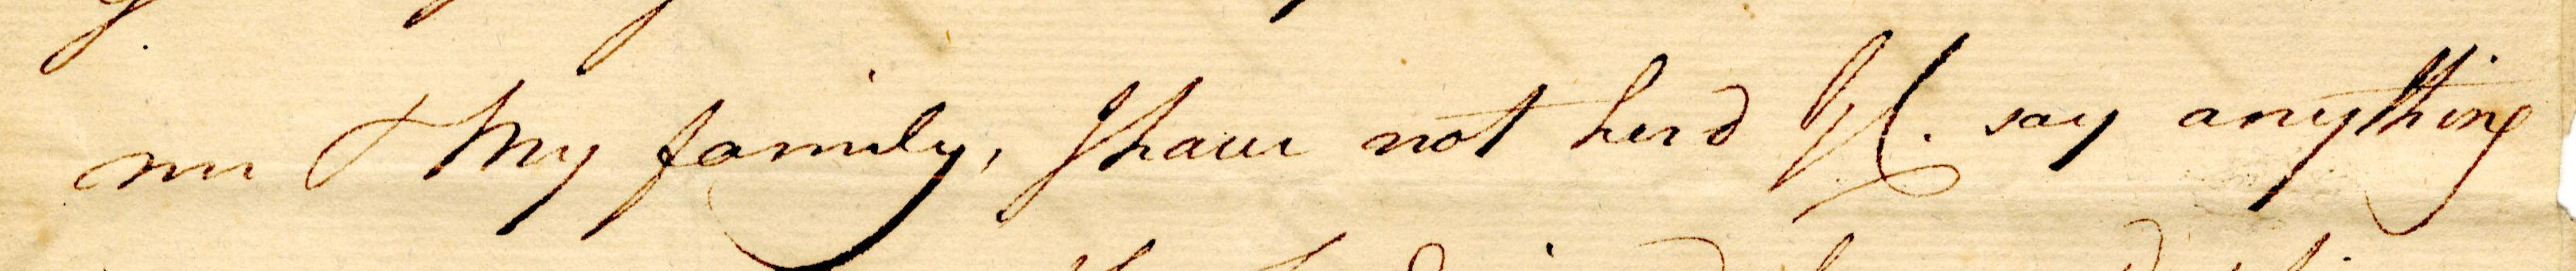me & my family, I have not herd GC. say anything
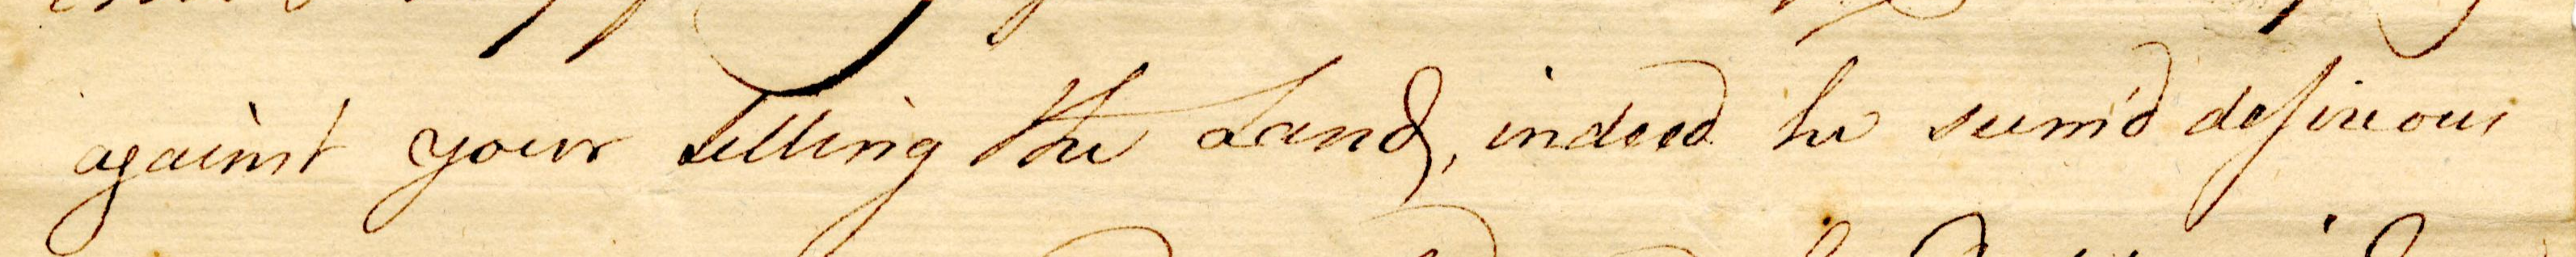against your selling the Land, indeed he seem'd desirous
